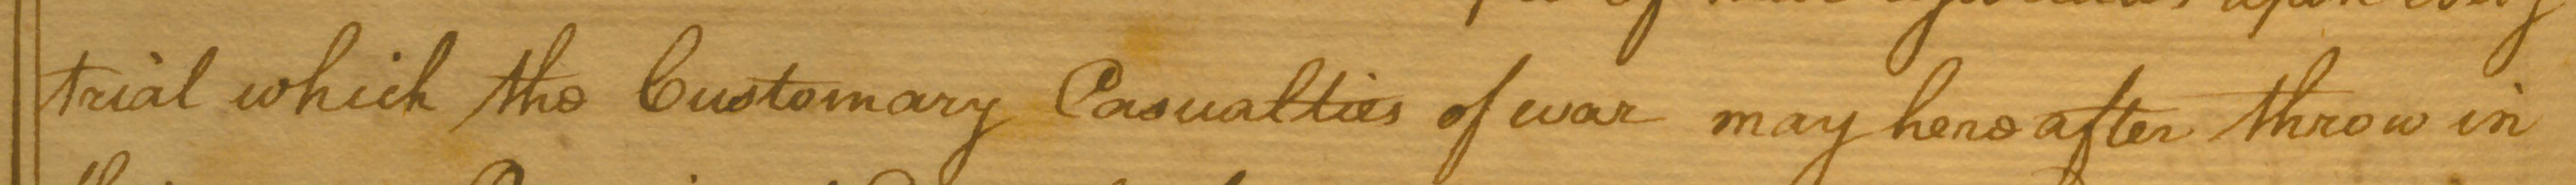trial which the Customary Casualties of war may hereafter throw in
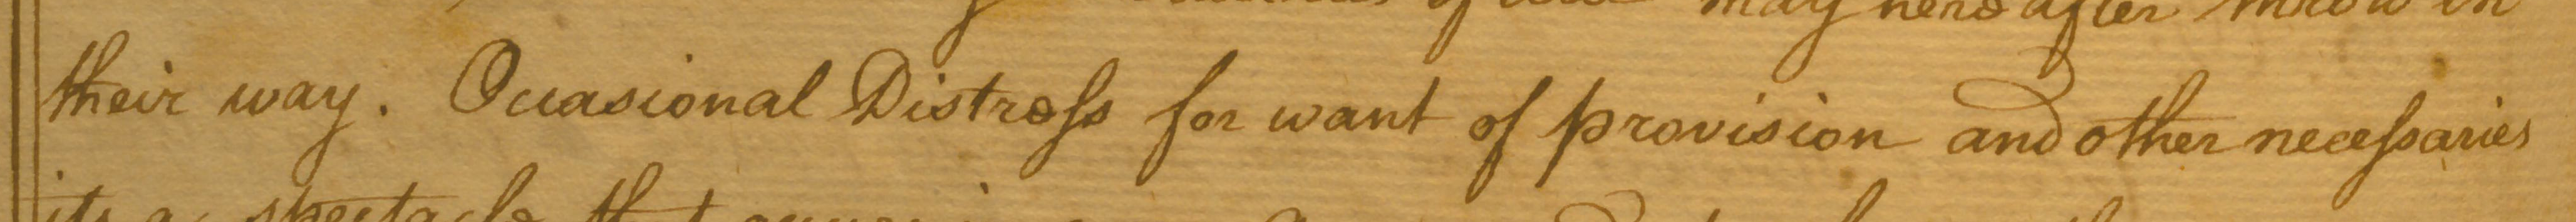their way. Occasional Distress for want of provision and other necessaries
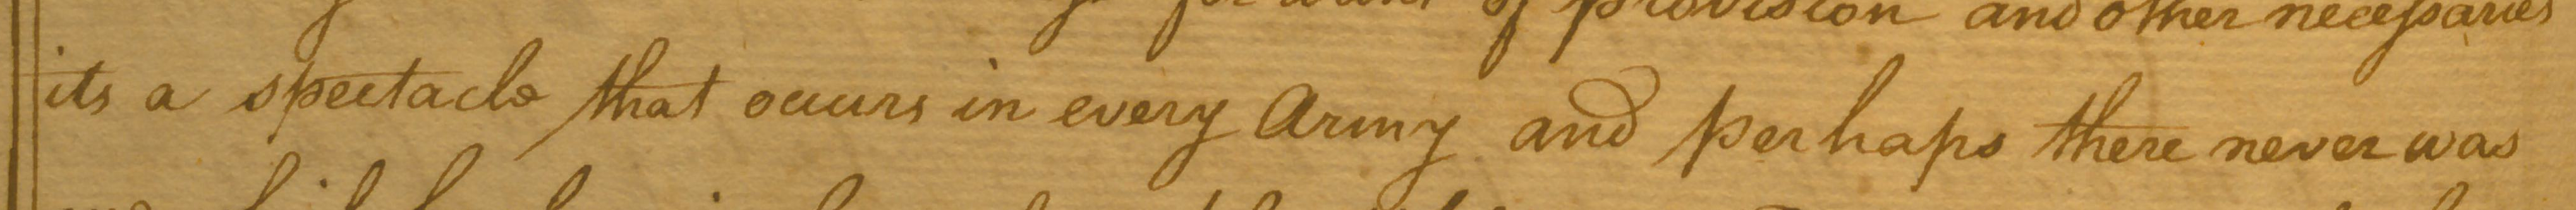its a spectacle that occurs in every Army and perhaps there never was
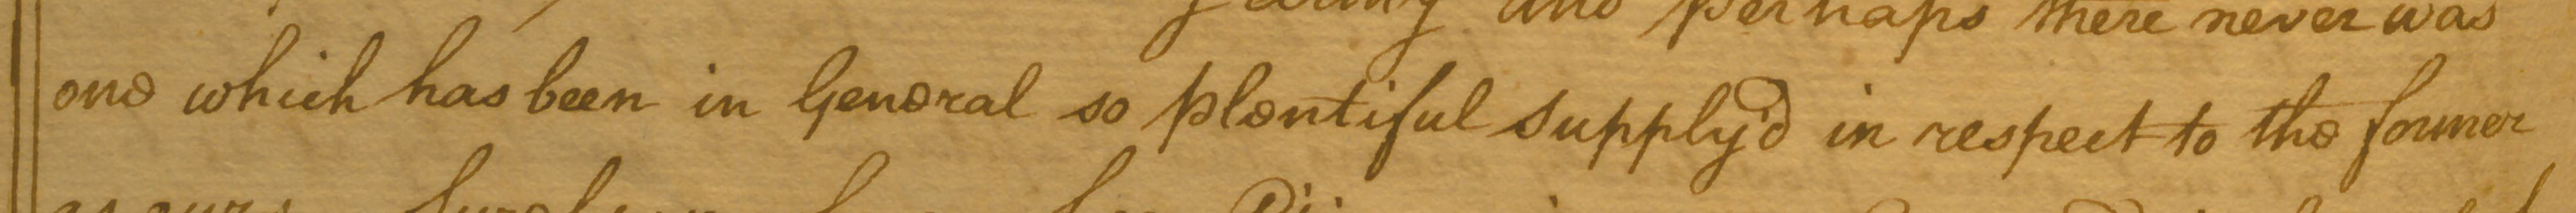one which has been in General so plentiful supply'd in respect to the former
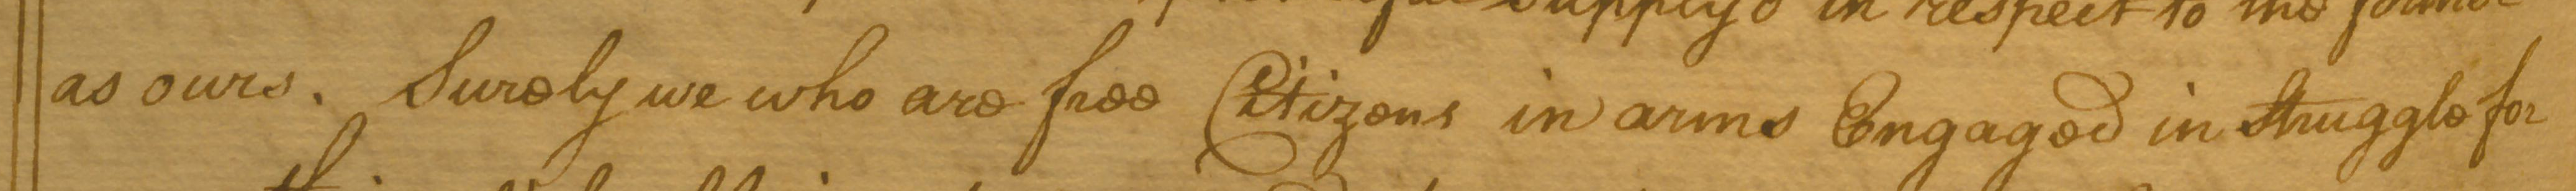as ours. Surely we who are free Citizens in arms Engaged in Struggle for
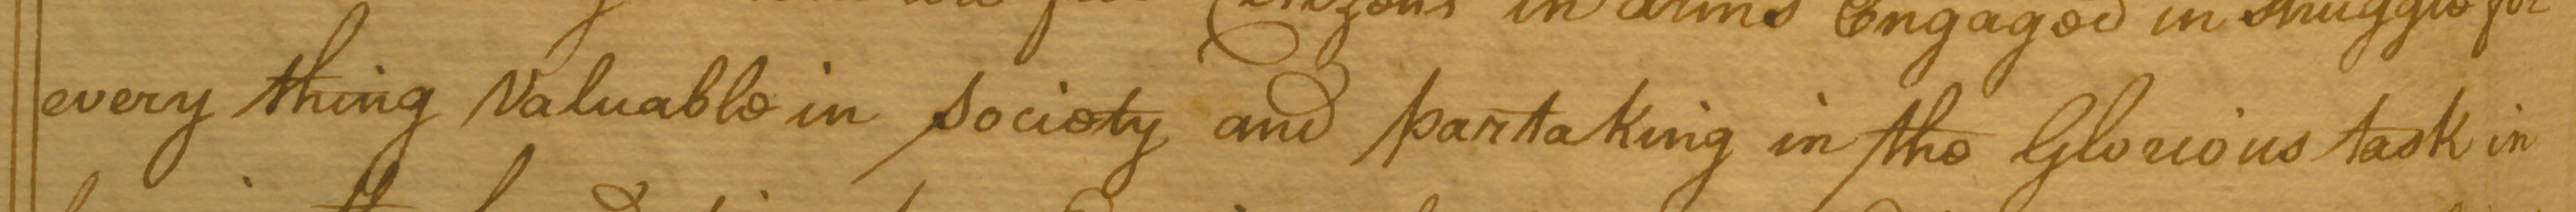every thing valuable in society and partaking in the Glorious task in
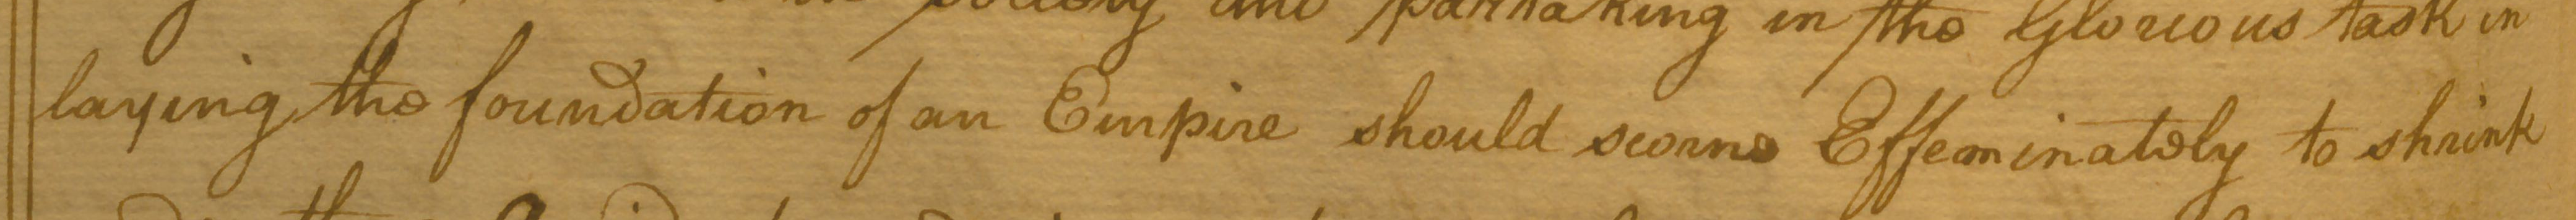laying the foundation of an Empire should scorne Effeminately to shrink
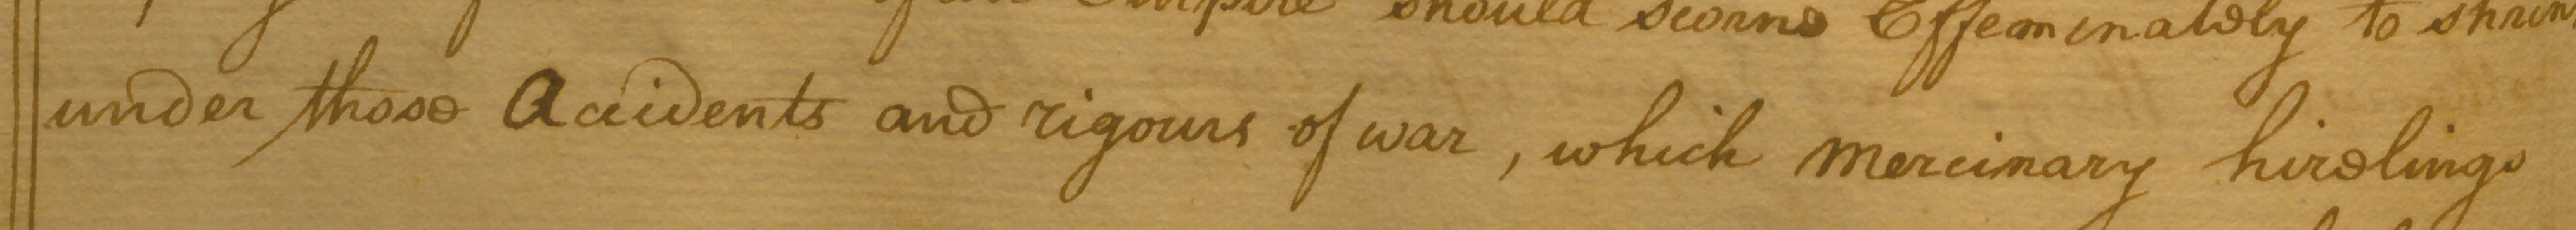under those Accidents and rigours of war, which mercinary hirelings
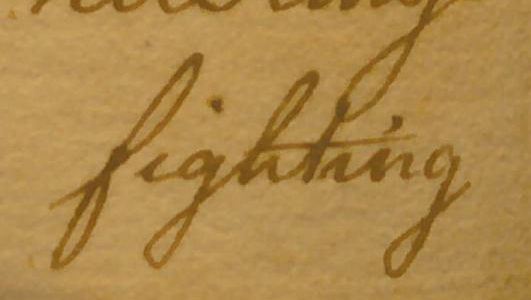fighting
